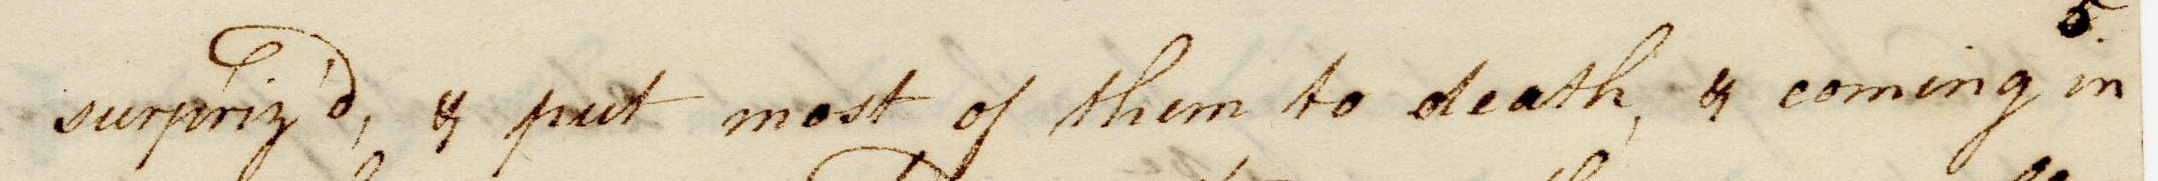surpriz'd, & put most of them to death, & coming in
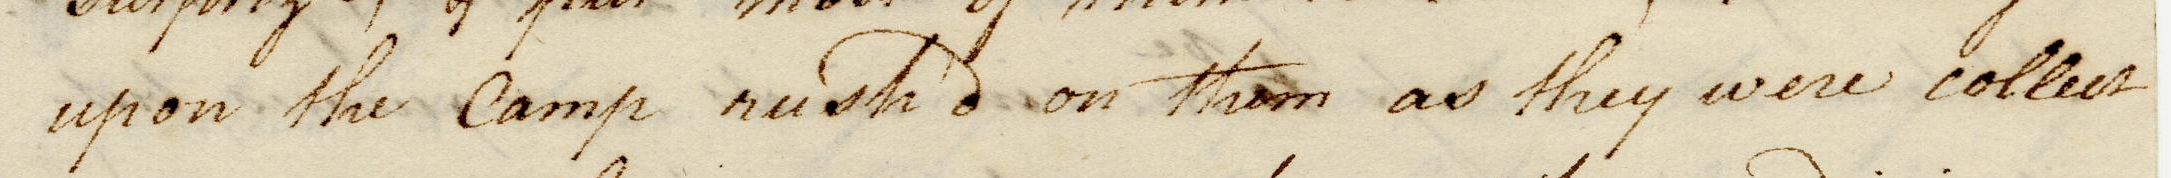upon the Camp ruish'd on them as they were collect
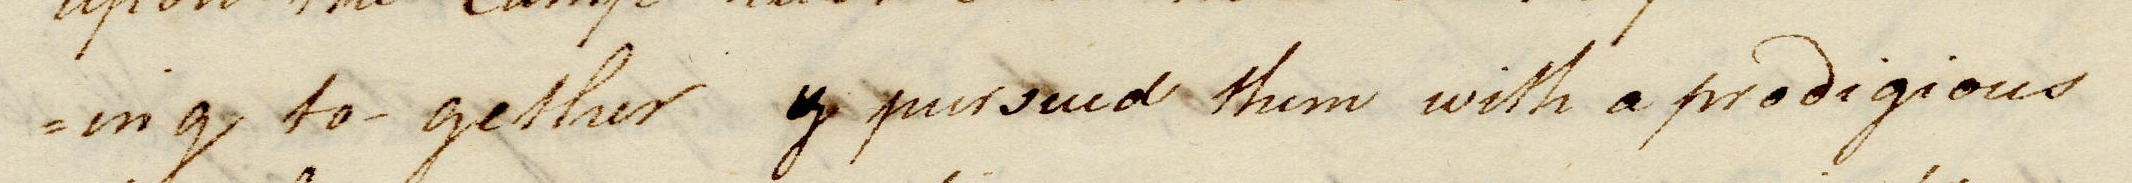-ing, to-gether & pursued them with a prodigious
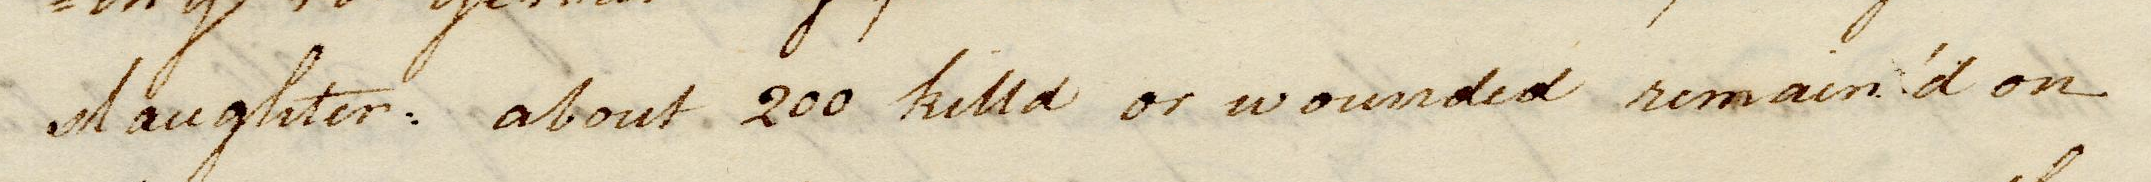slaughter: about 200 killd or wounded remain'd on
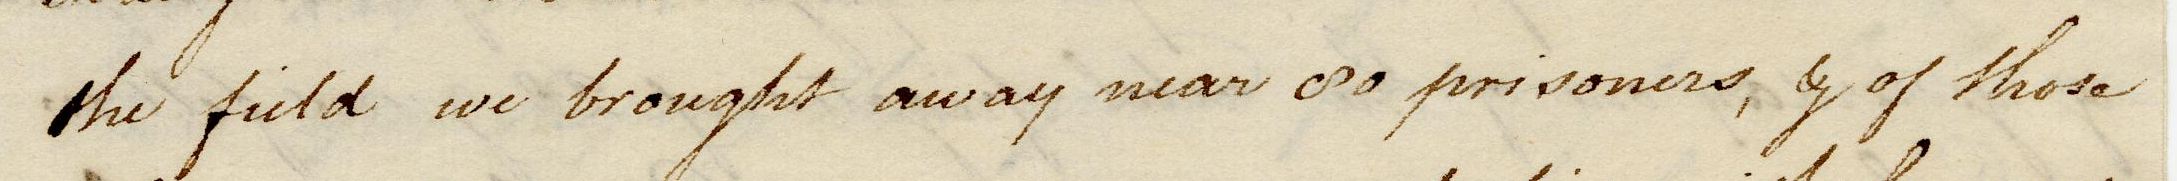the field we brought away near 80 prisoners, & of those
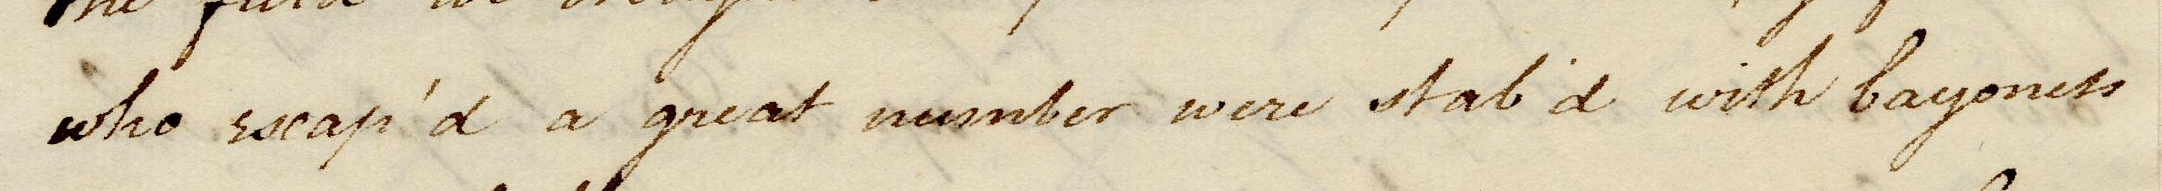who escap'd a great number were stab'd with bayonets
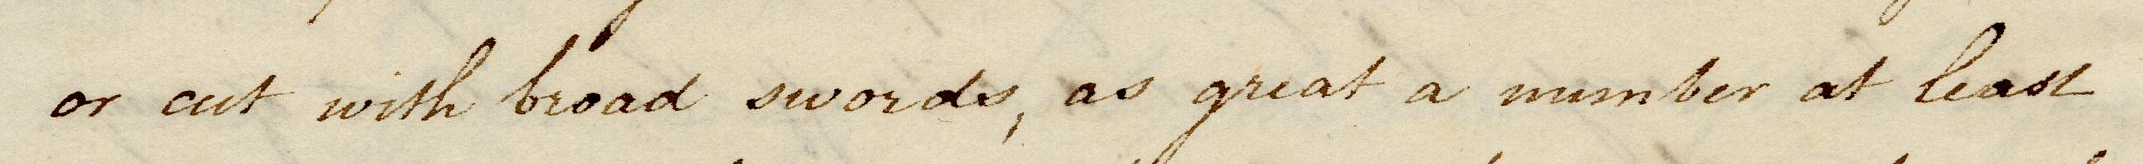or cut with broad swords, as great a number at least
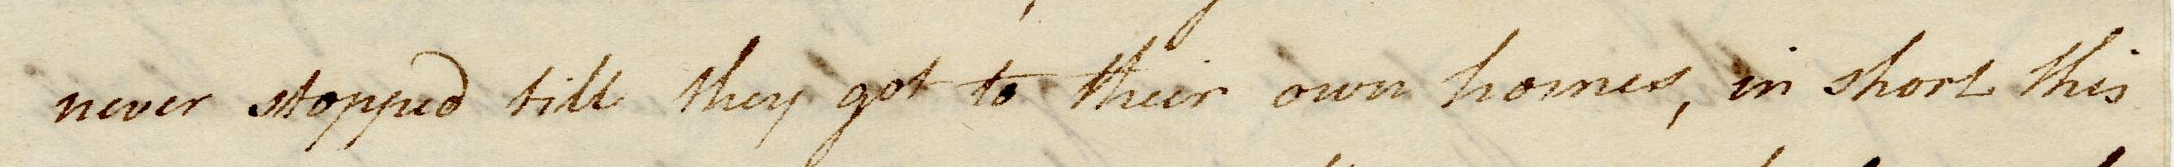never stopped till they got to their own homes, in short this
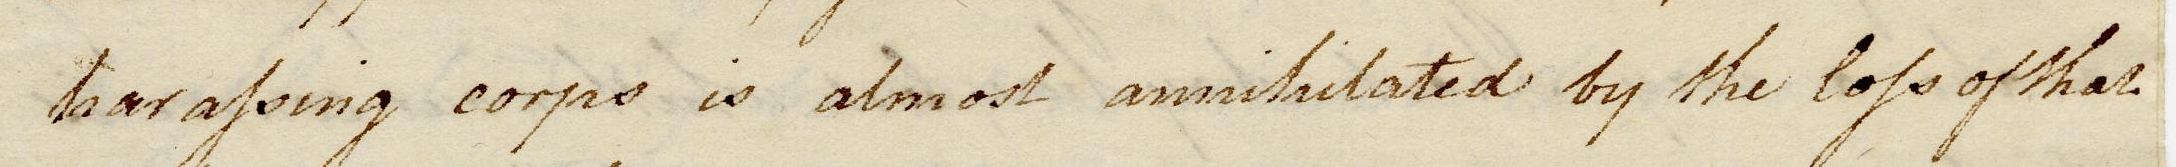harassing corps is almost annihilated by the loss of that
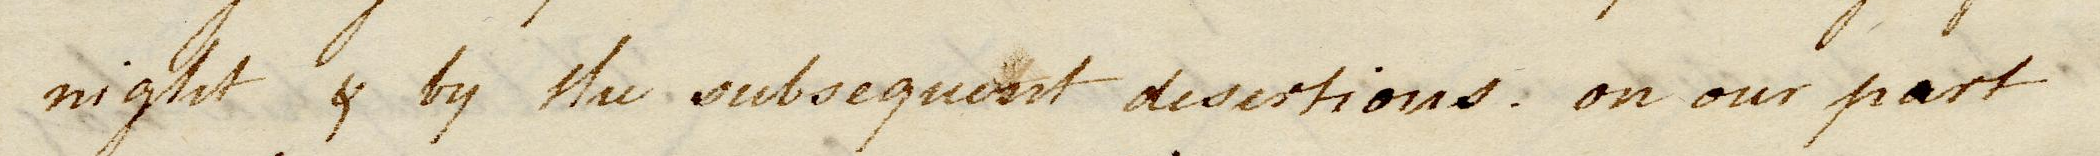night & by the subsequent desertions. on our part
